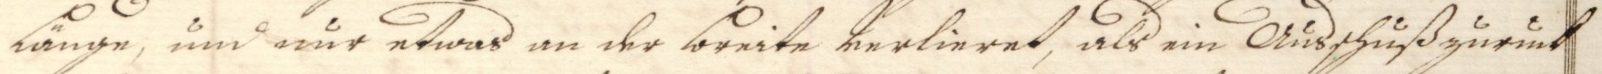Länge, und nur etwas an der Breite verlieret, als ein Ausschuß zuruck
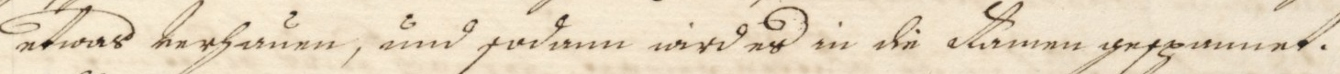etwas verhauen, und sodann wird es in die Ramen gespannet.
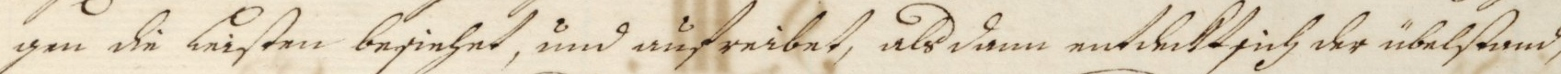gen die Leisten besiehet, und ausfreibet, als dann entdeckt sich der übelstand,
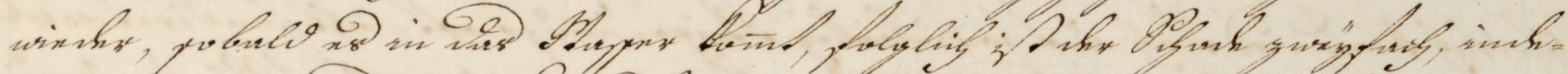wieder, sobald es in das Wasser kommt, folglich ist der Schade zweyfach, inde-
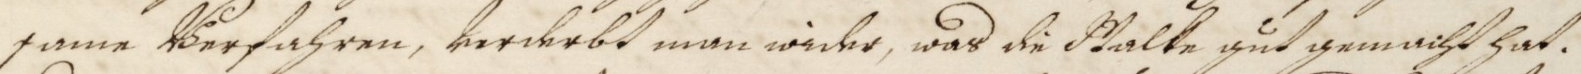same Verfahren, verderbt man wider, was die Walke gut gemacht hat.
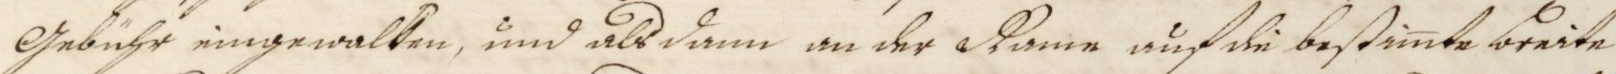Gebühr eingewalken, und als dann an der Rame auf die bestimmte Breite
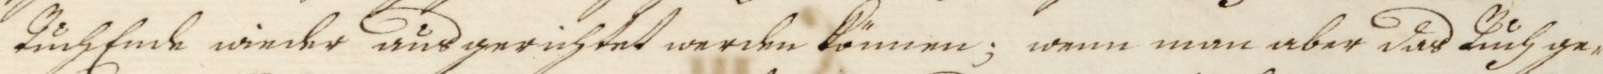TuchEnde wieder ausgerichtet werden können; wenn man aber das Tuch ge-
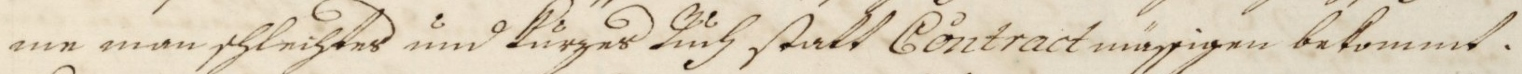me man schlechtes und kurzes Tuch statt Contract mässigen bekommt.
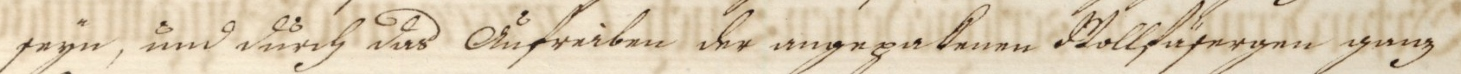seyn, und durch das Aufreiben der angepakenen Wollfäsergen ganz
